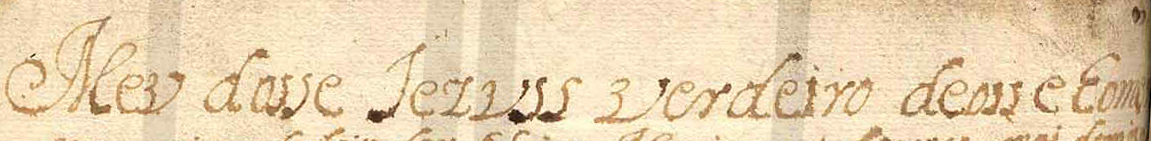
MeV dosse IeZVSS Verdeiro deoss e home
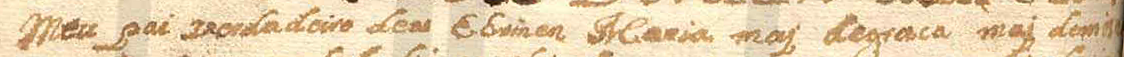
meu pai verdadeiro deos E homen Maria may de graça maj de mise
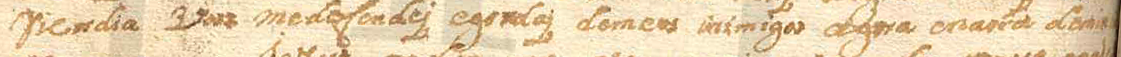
ricordia ven me defendej e gordaj de meos inimigos agora e na ora de min
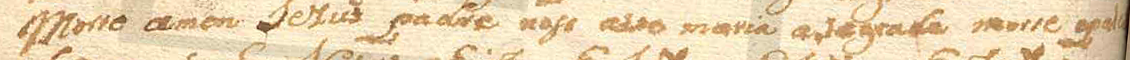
Morte amem Iezus padre noso ave maria a sagrada morte e pala
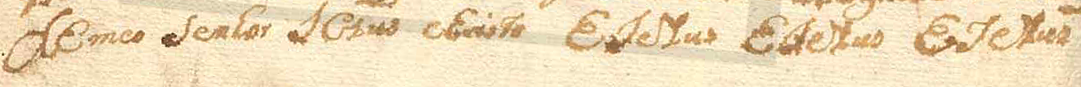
DE meo Senhor Iezus christo E IeZus E IeZus E IeZus
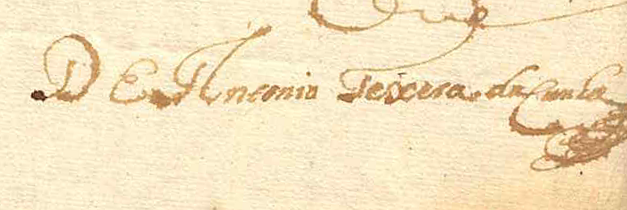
DE Antonio Texera da Cunha
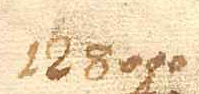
128000
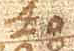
40
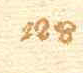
128
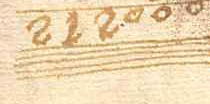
212.000
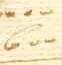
600
